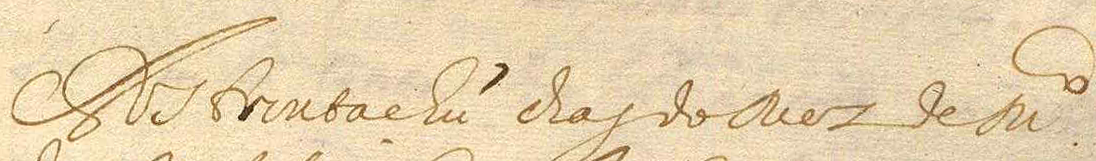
Aos trinta e hū dias do Mez de ou.ro
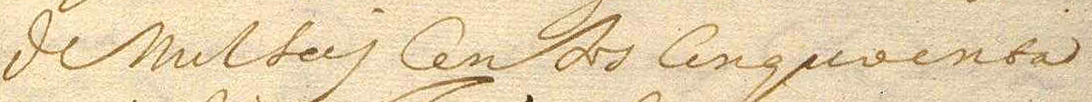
de mil seiscentos cinquoenta
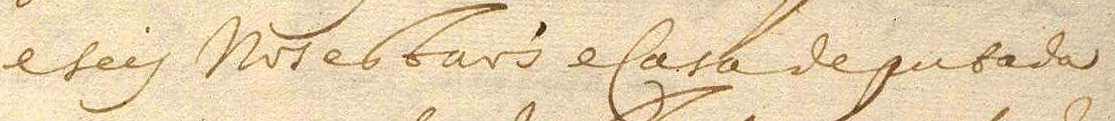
e seis nos estaos e Casa deputada
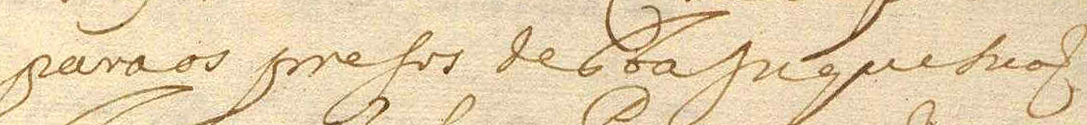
para os presos desta Jnquesiçaõ
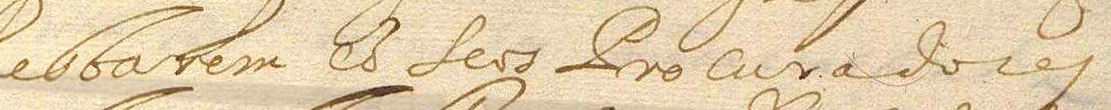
estarem cō seos Procuradores
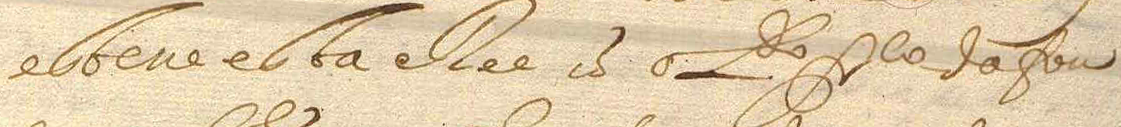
esteue esta Ree cō o L.do frco da fon
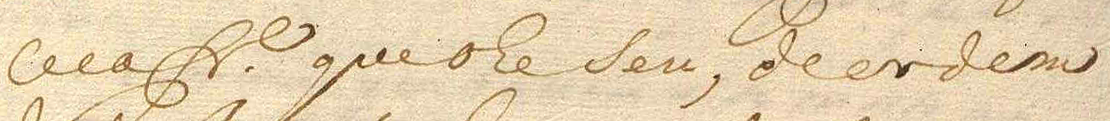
ceca fr.a que o he seu, de ordem
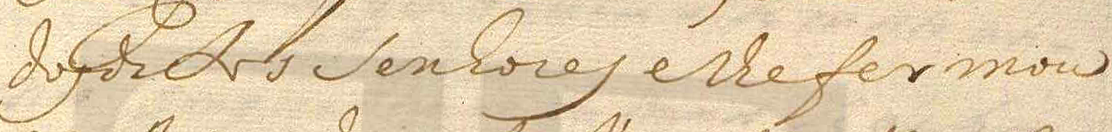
dos ditos Senhores, e lhe fermou
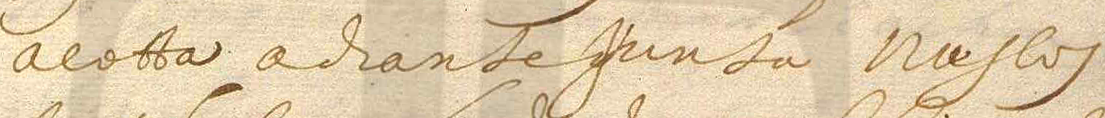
a cotta adiante Junta nas cos
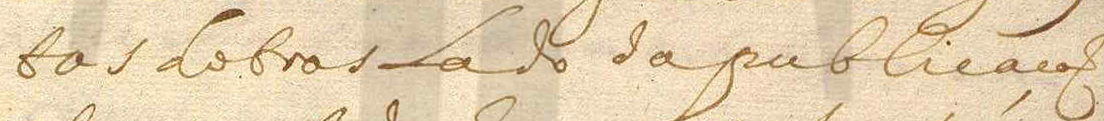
tas do traslado da publicaçaõ
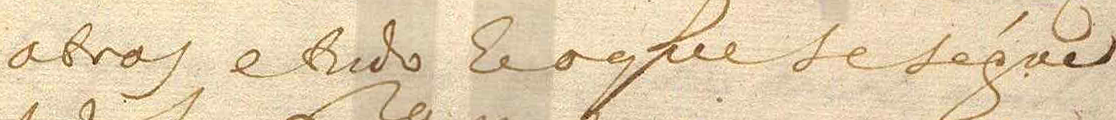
atras e tudo he o que se segue
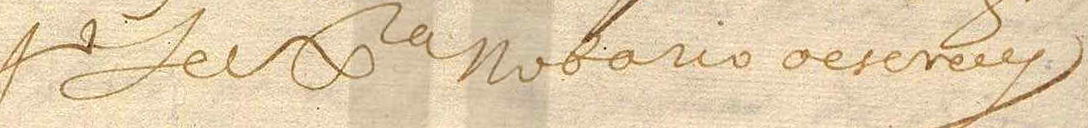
Jo teixra notario o escreuj
